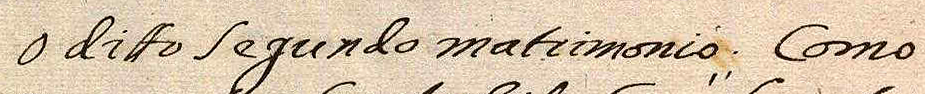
o ditto segundo matrimonio; Como
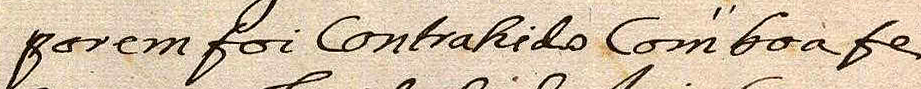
porem foi Contrahido Com boa fe
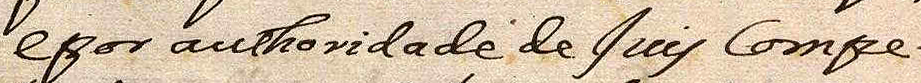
e por authoridade de Juis Compe
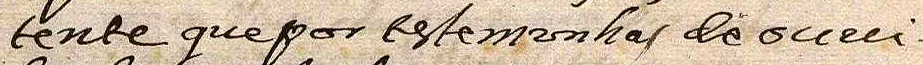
tente que por testemunhas de ouui
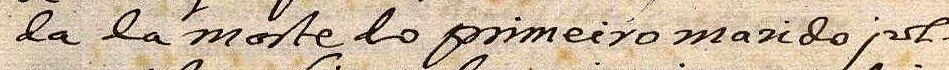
da da morte do primeiro marido jul
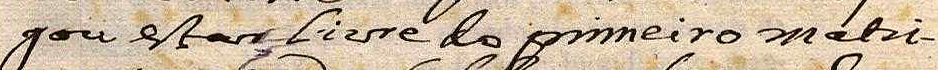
gou estar livre do primeiro matri
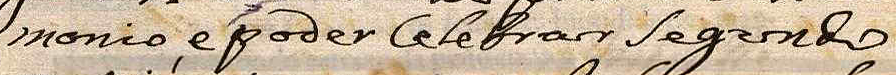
monio, e poder Celebrar segundo
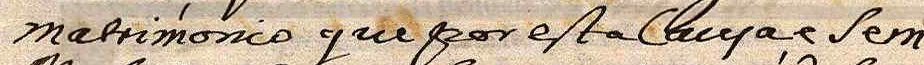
matrimonio que por esta Causa, e sem
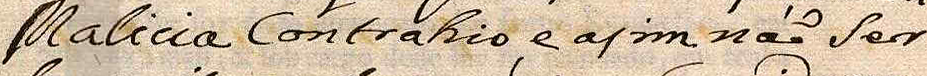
Malicia Contrahio, e asim naõ ser
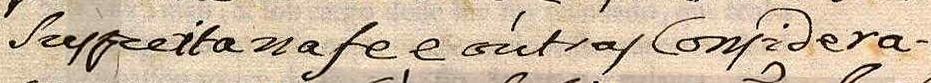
suspeita na fe, e outras Considera
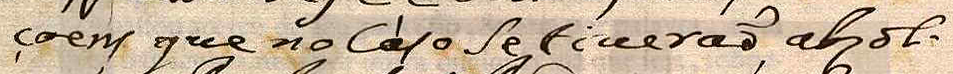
çoens que no Cáso se tiueraõ, absol
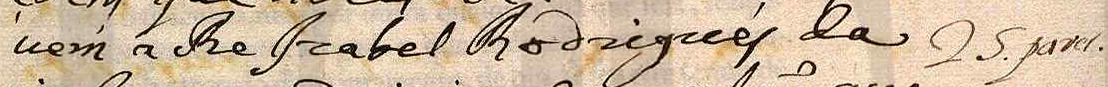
uem a Re Jzabel Rodrigues da 25. parer.
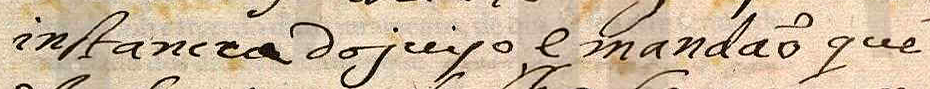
instancia do juiso, e mandaõ que
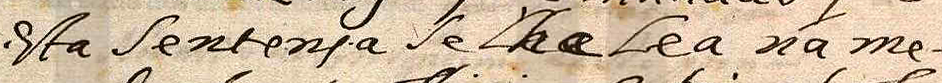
esta sentensa se lhe lea na me
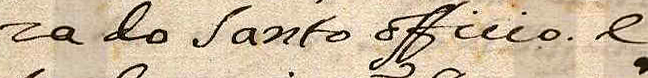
za do Santo officio. e
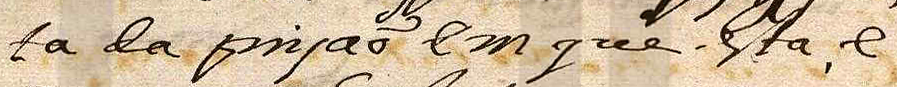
ta da prisaõ em que esta, e
